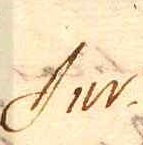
Jur.
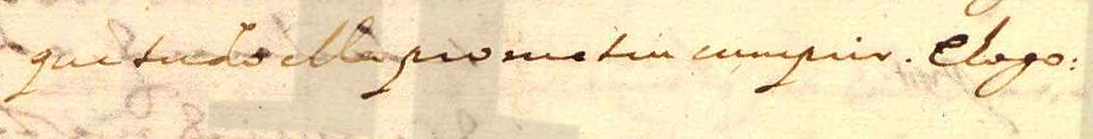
que tudo ella prometeu cumprir. E logo:
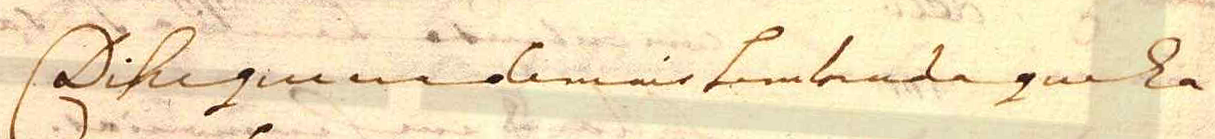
Disse que era de mais lembrada que ha
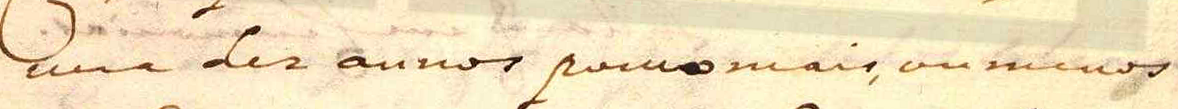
uera dez annos pouco mais, ou menos
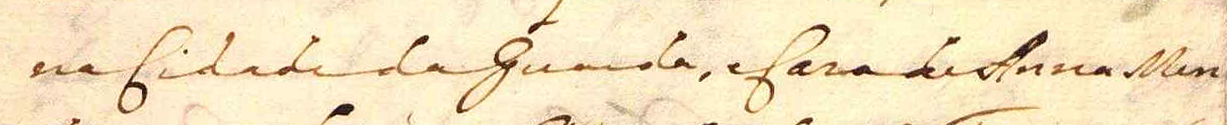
na Cidade da Guarda, e Caza de Anna Men
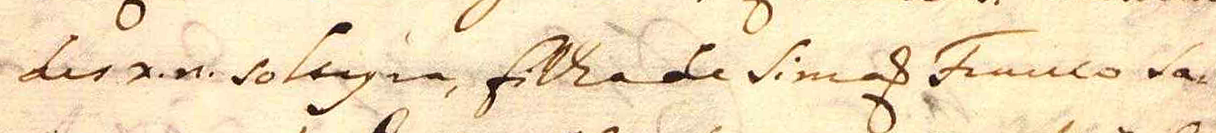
des x. n. solteyra, filha de Simaõ Franco sa
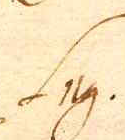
Lug.
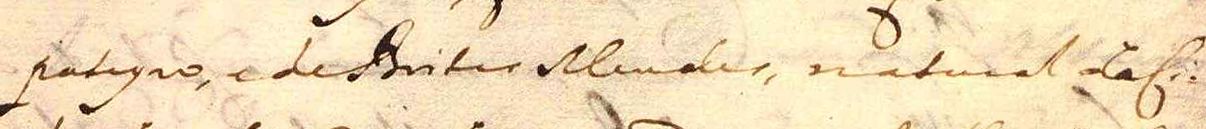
pateyro, e de Brites Mendes, natural da Ci
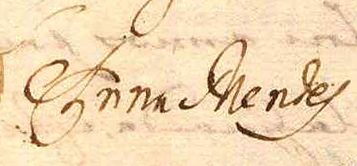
Anna Mendes
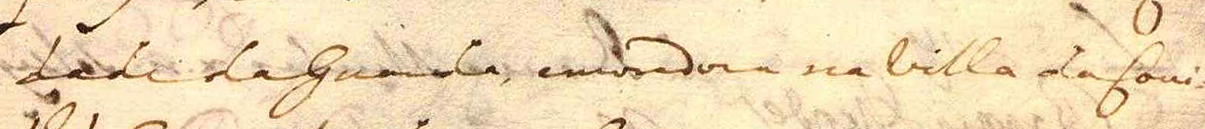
dade da Guarda, e moradora na Villa da Coui
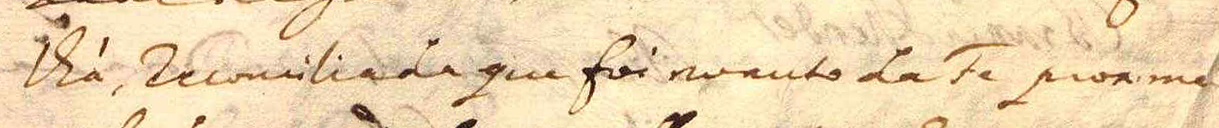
lhã, Reconciliada que foi no auto da Fe proxime
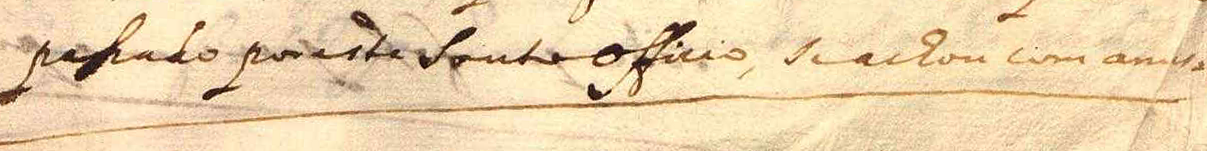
passado por este santo officio, se achou com a mes
